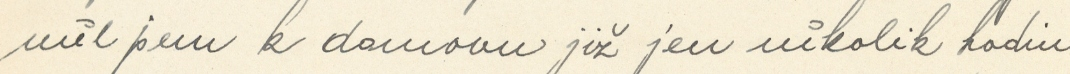měl jsem k domovu již jen několik hodin
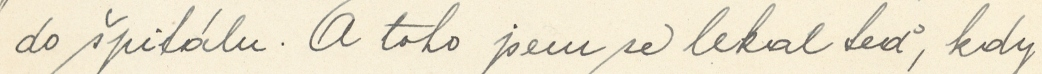do špitálu. A toho jsem se lekal teď, kdy
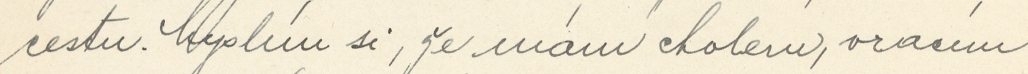cestu. Myslím si, že mám choleru, vracím
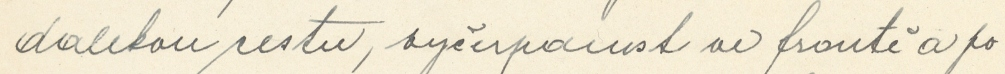dalekou cestu, vyčerpanost ve frontě a po-
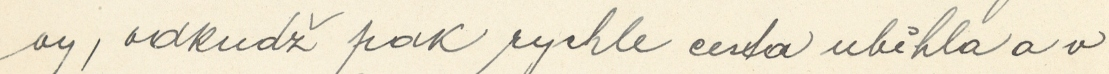vy, odkudž pak rychle cesta uběhla a v
